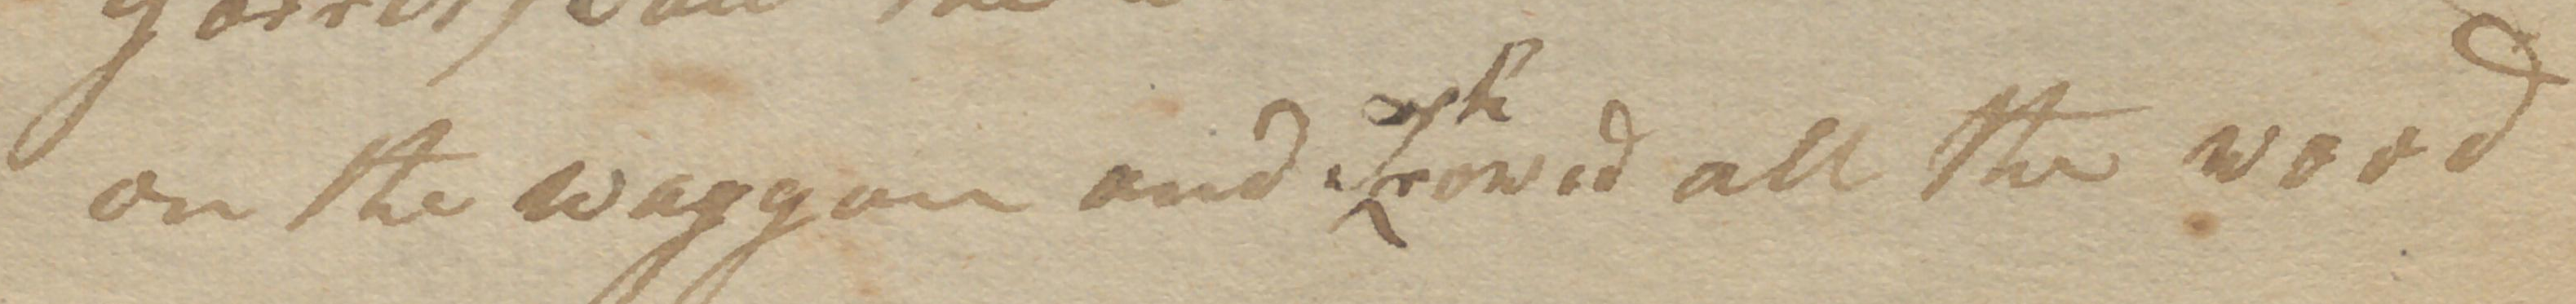on the waggon and Trowed all the wood
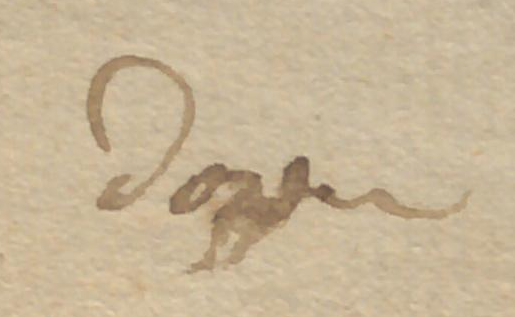down
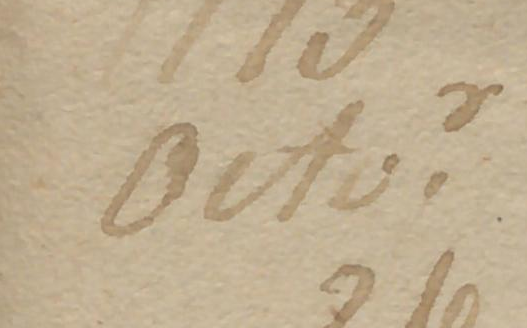Octo^r.
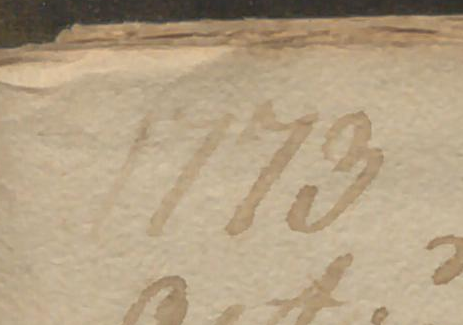1773
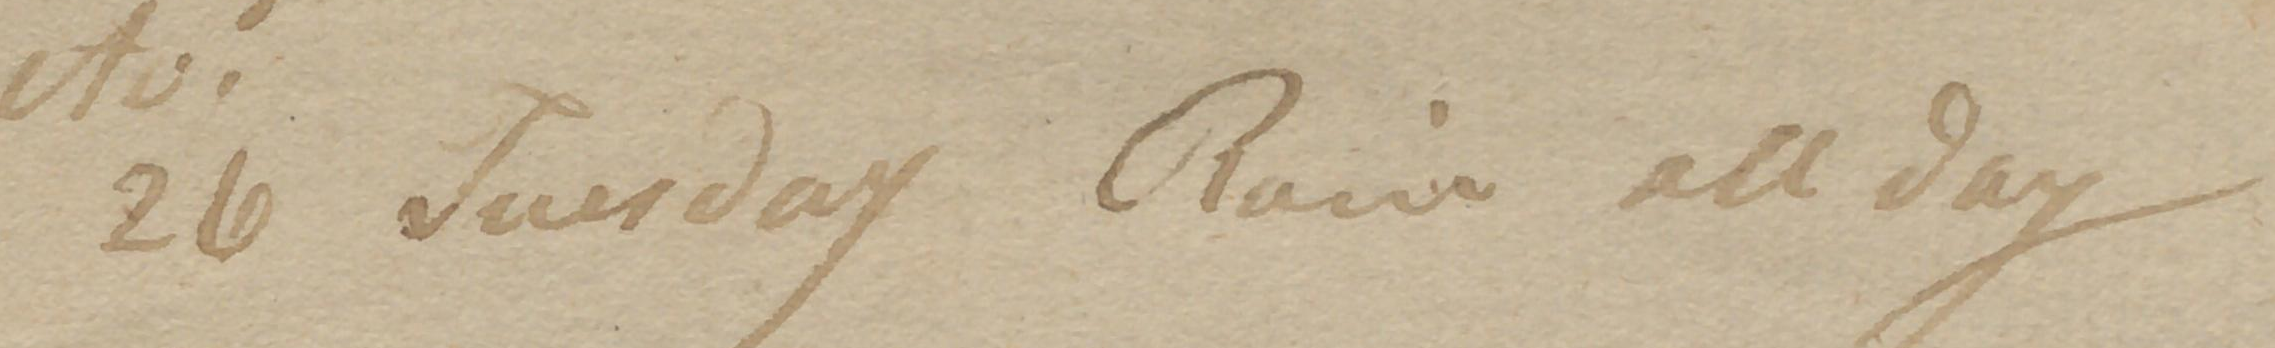26 Tuesday Rain all day
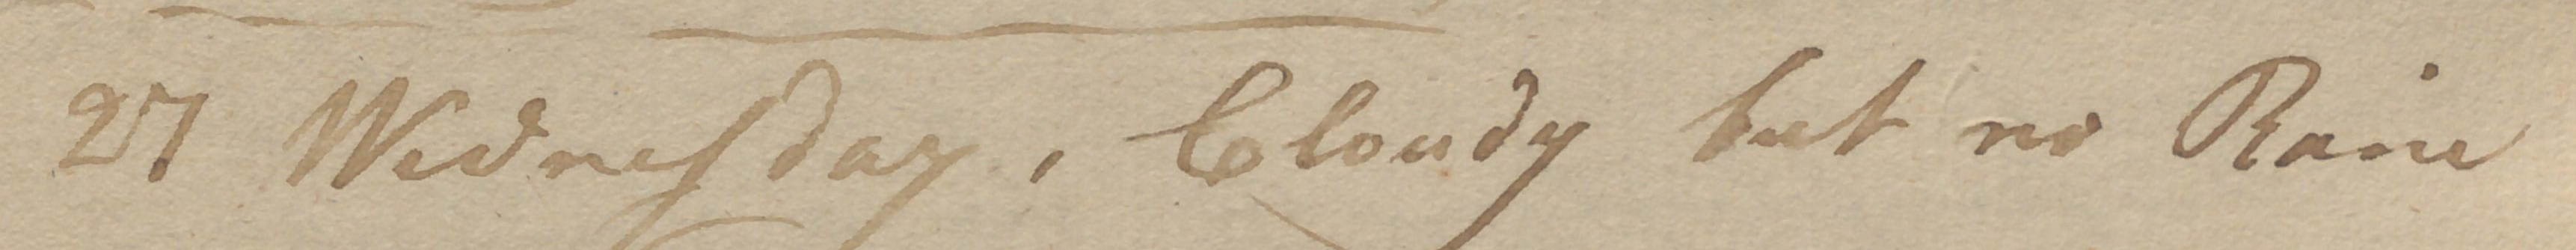27 Wednesday. Cloudy but no Rain
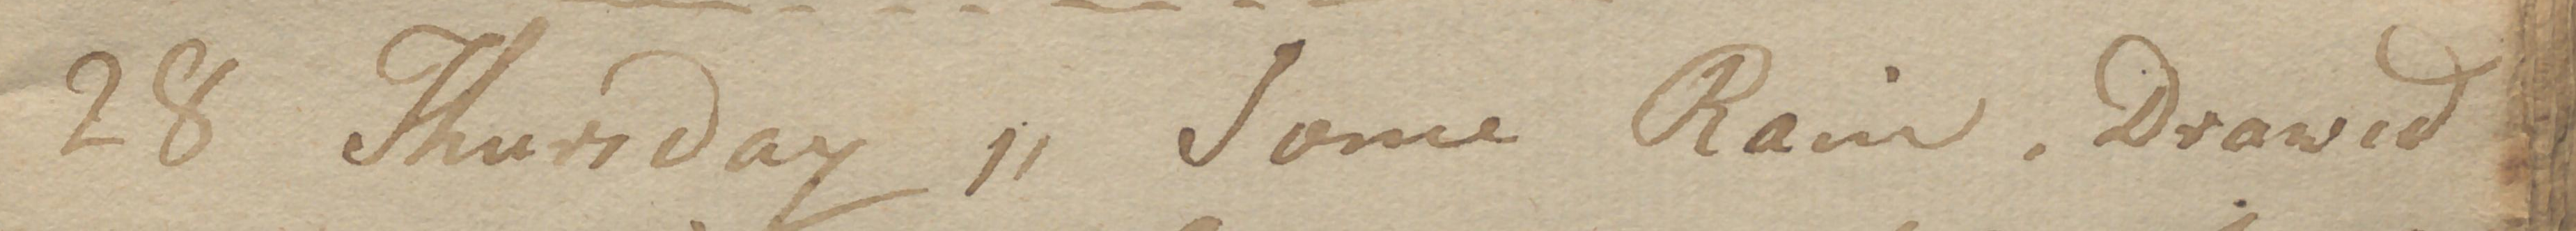28 Thursday, Some Rain. Drawed
